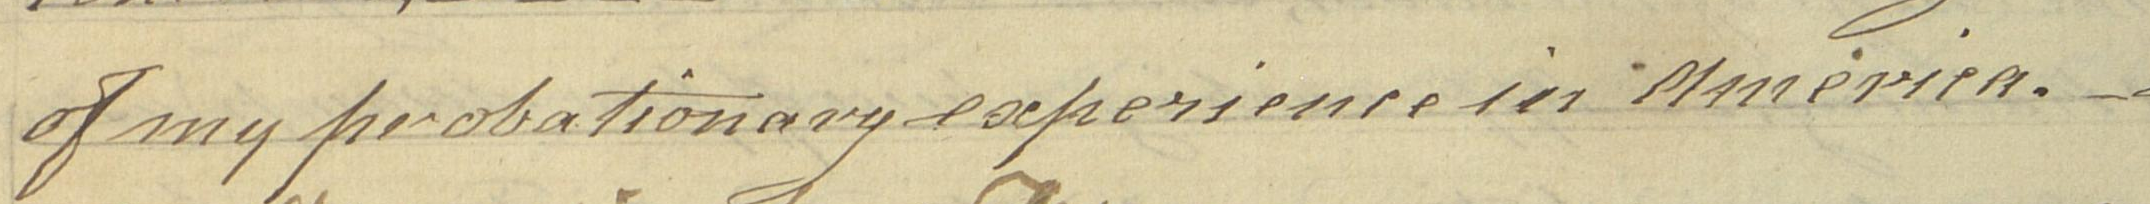of my probationary experience in America
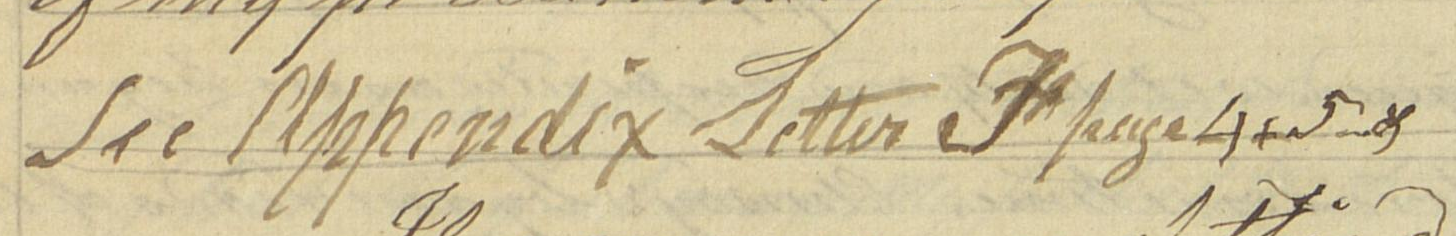See Appendix Letter F page 4 + 5 &
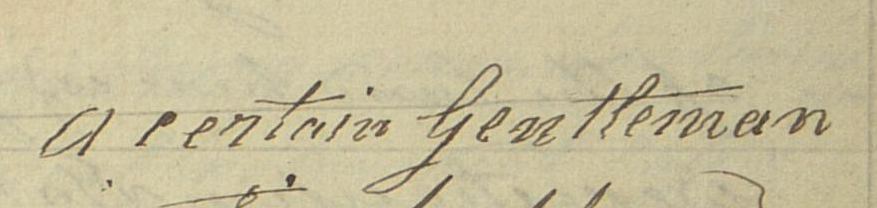A certain Gentleman
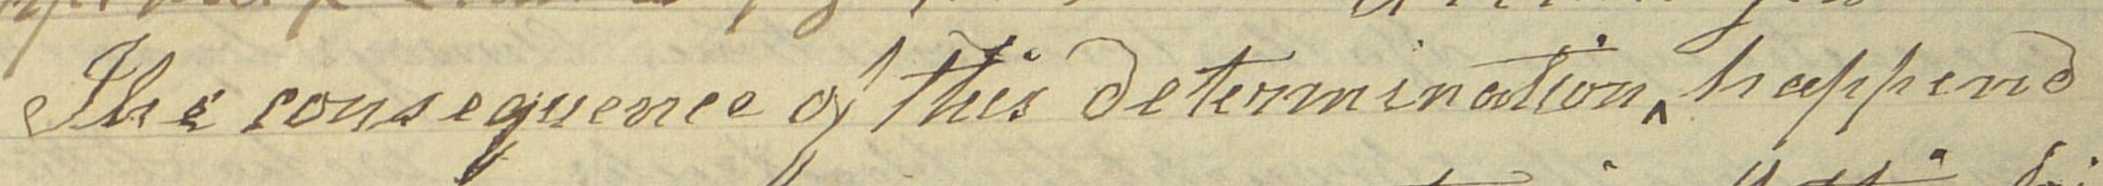The consequence of this determination ^ happend
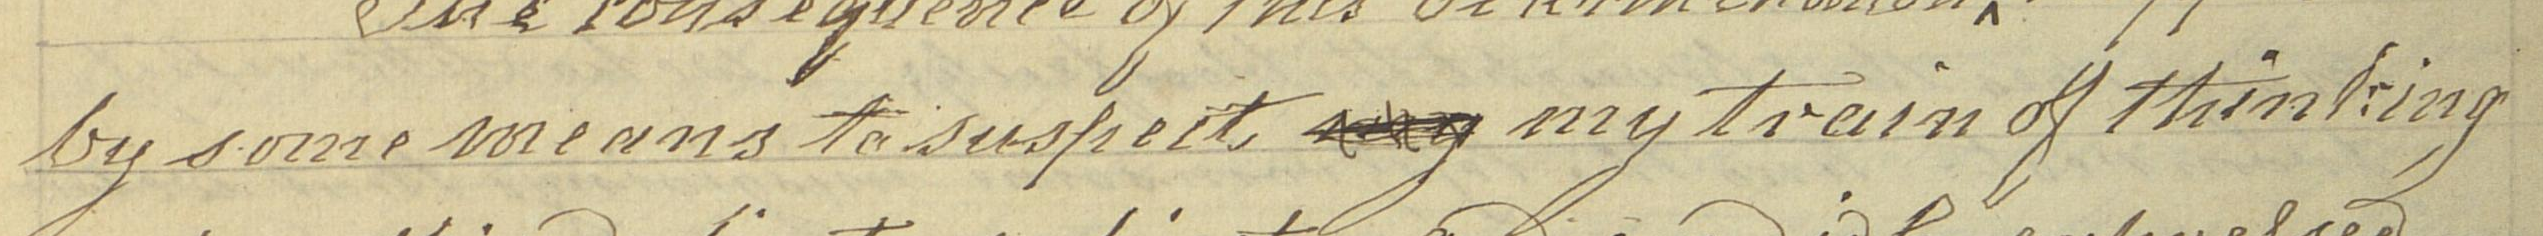by some means to suspect my my train of thinking
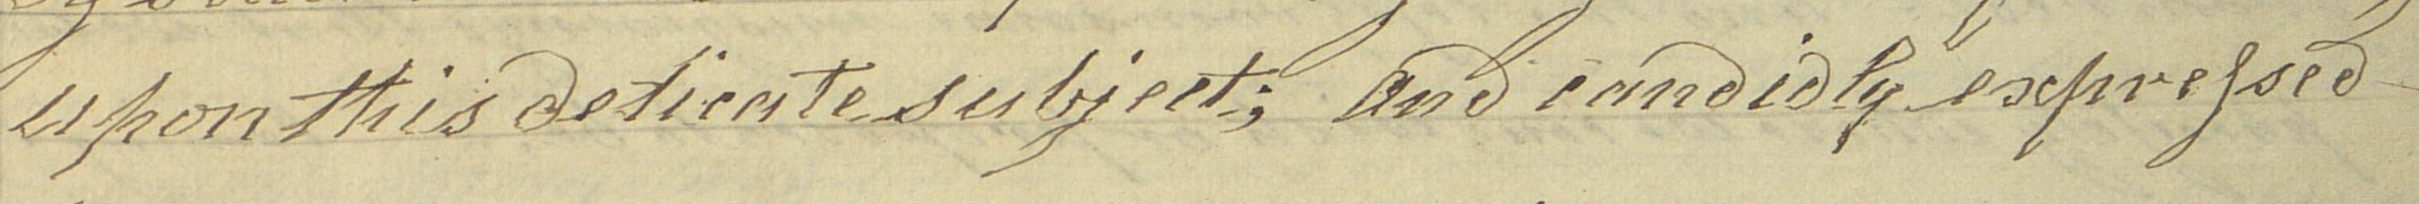upon this delicate subject; and candidly expressed
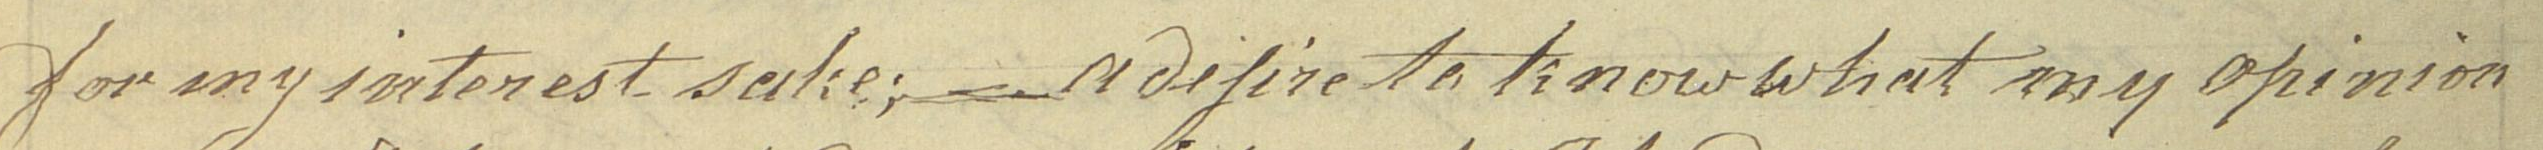for my interest sake; a desire to know what my opinion
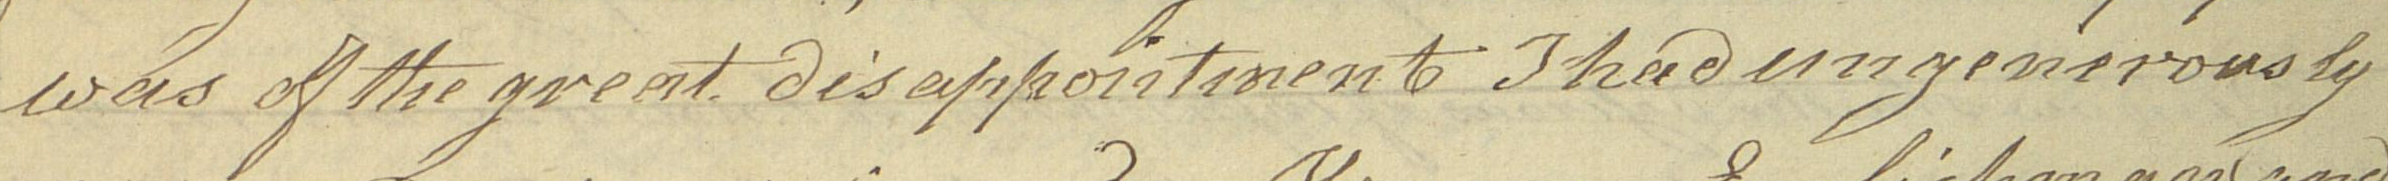was of the great disappointiment I had ingenerously
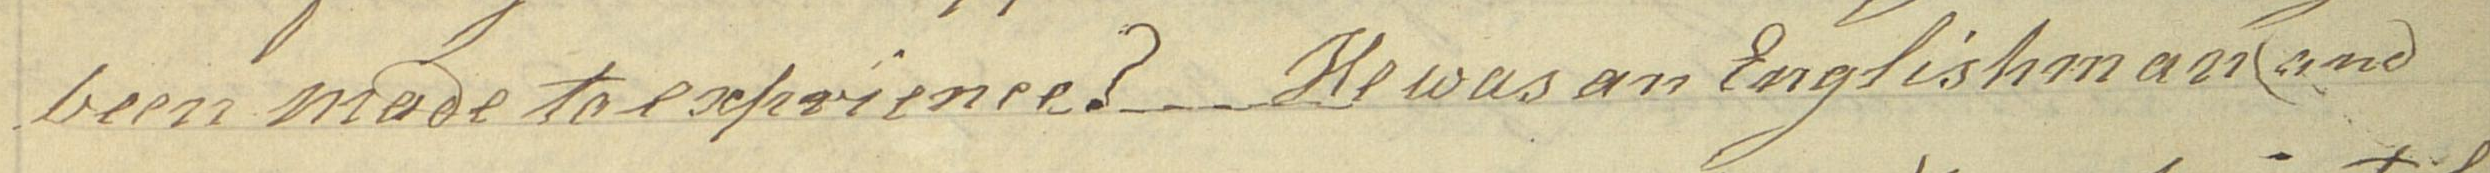been made to experience. He was an Englishman (and
